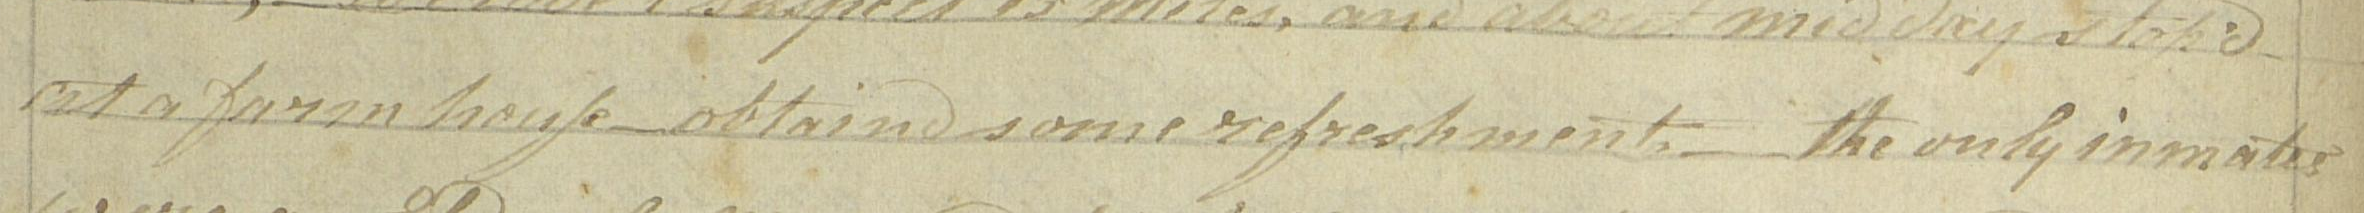at a farm house, obtaind some refreshment The only inmates
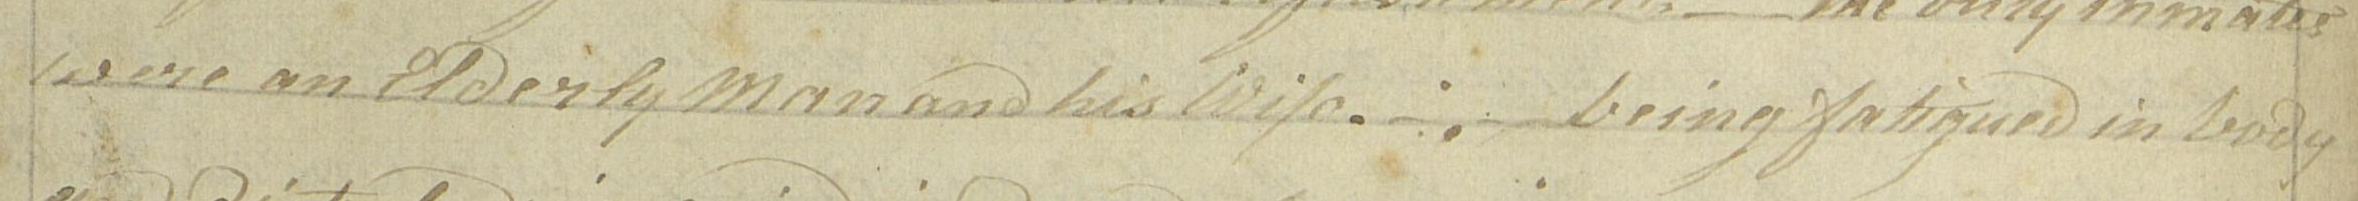were an Elderly Man and his Wife. being fatigued in body
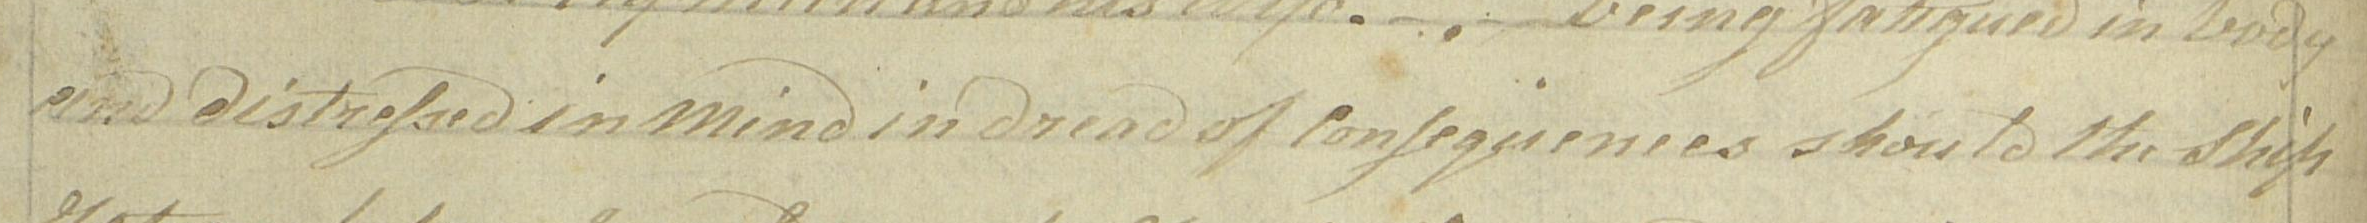and distressed in mind in dread of Consequences should the Ship
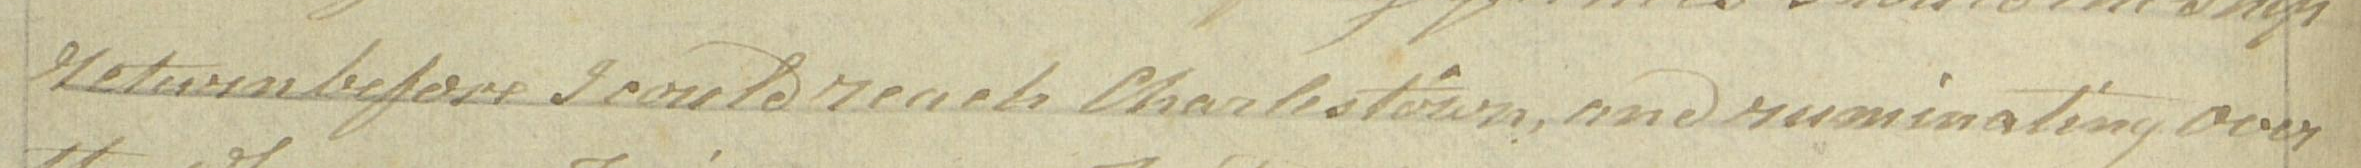Return before I could reach Charlestown, and ruminating over
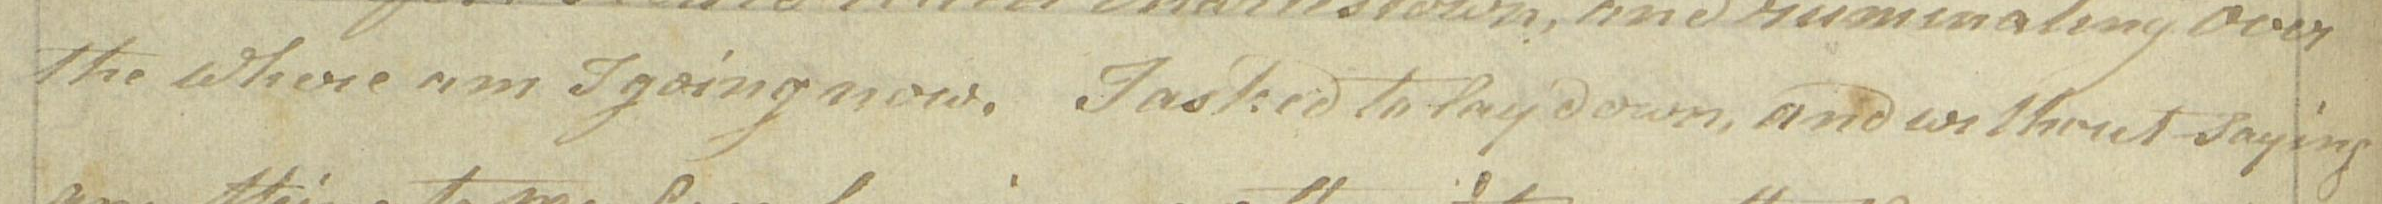the where am I going now. I asked to lay down, and without saying
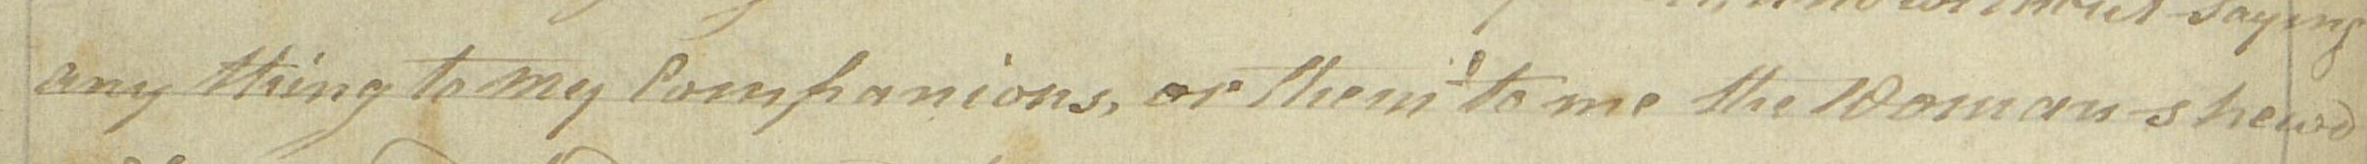any thing to my Companions, or them to me the Human shewd
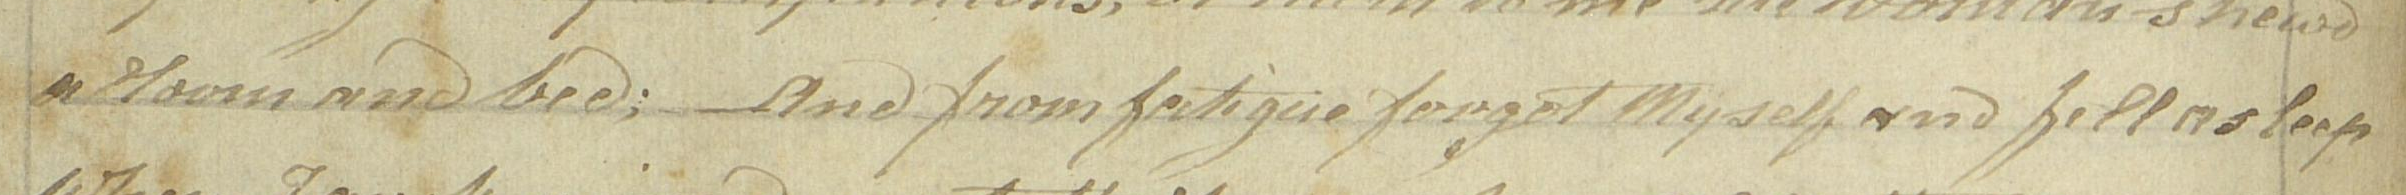a Room and bed; And from fatigue forget Myself and fell asleep
